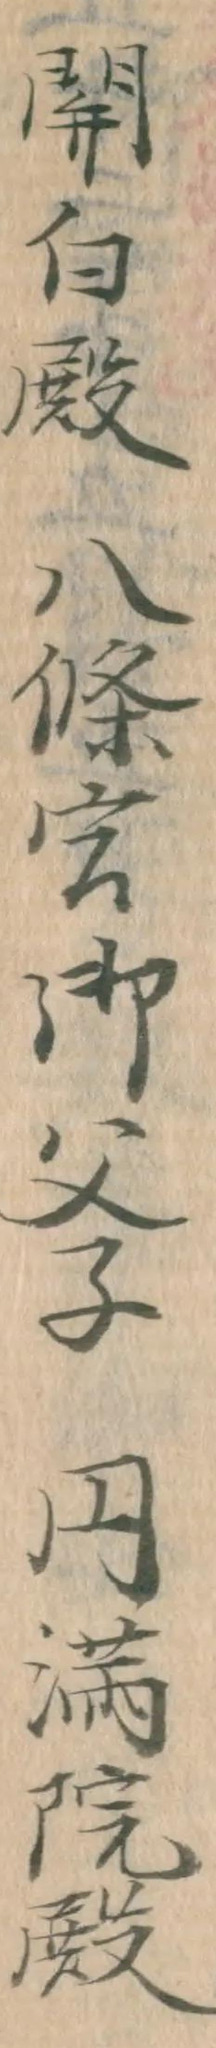関白殿八条宮御父子円満院殿
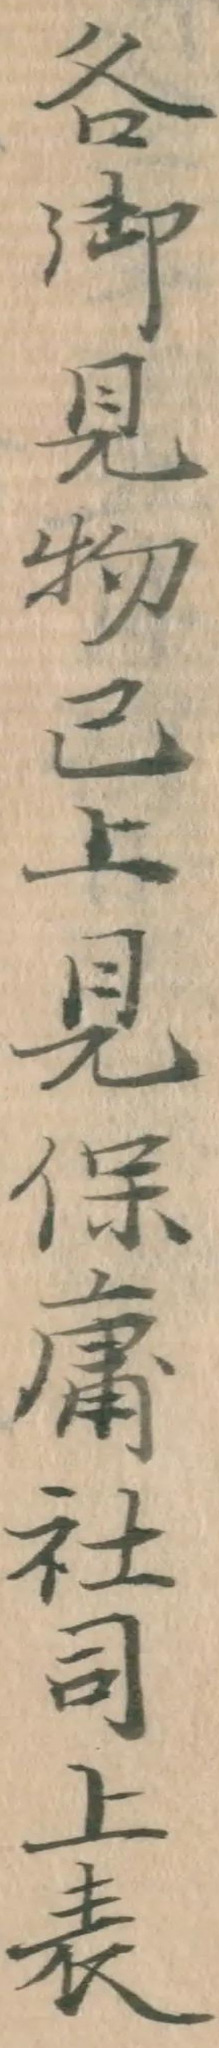各御見物己上見保庸社司上表
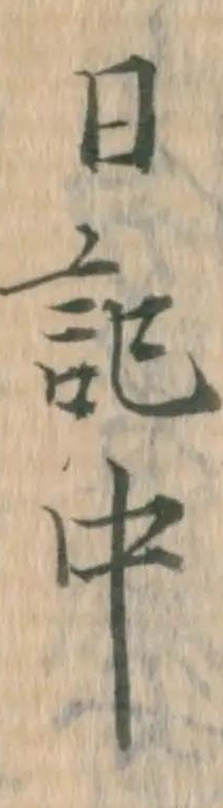日記中
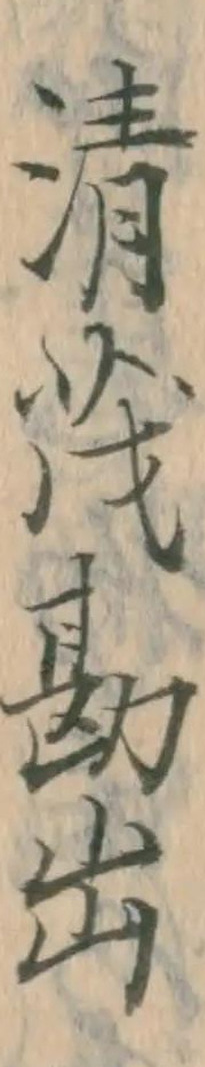清茂勘出
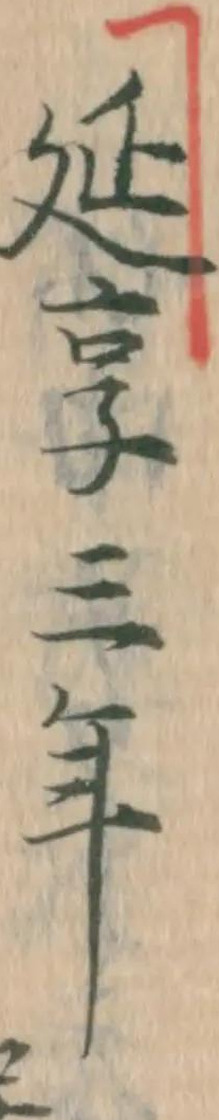延享三年
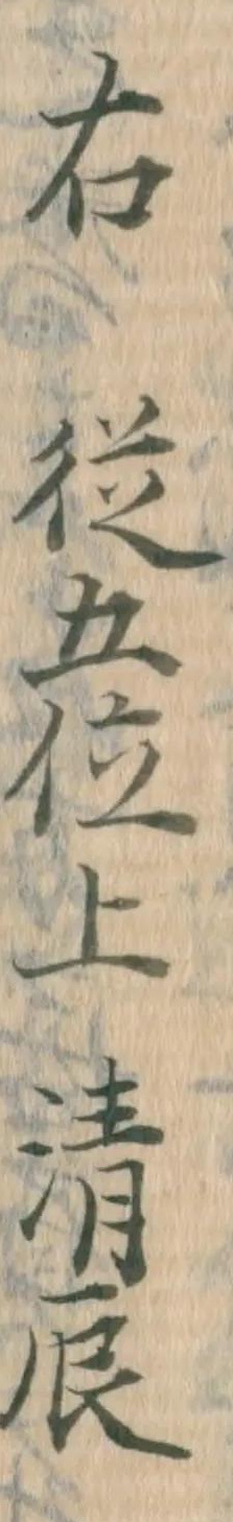右従五位上清辰
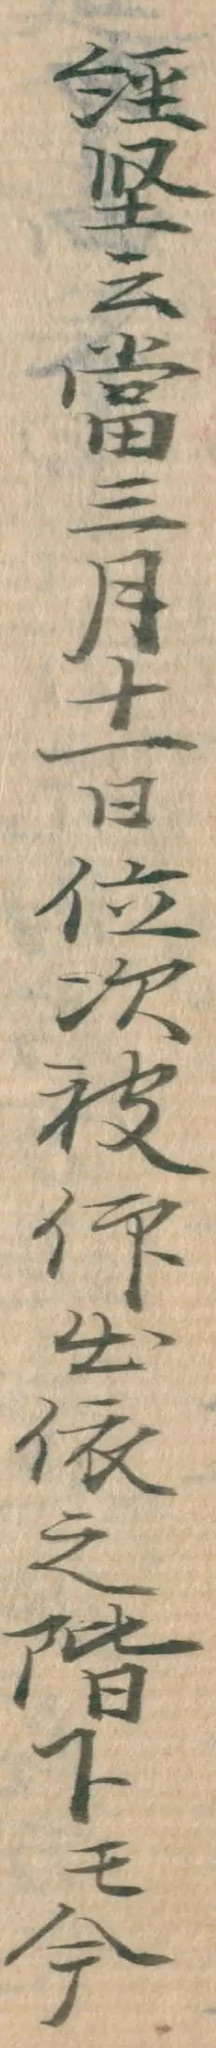経堅云当三月十一日位次被仰出依之階下モ今
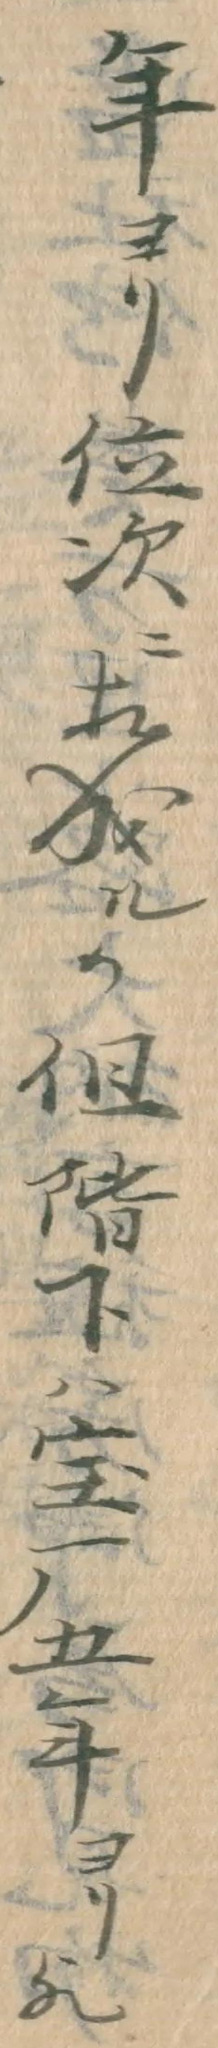年ヨリ位次ニ相成ルか但階下ハ宝暦五年ヨリ歟
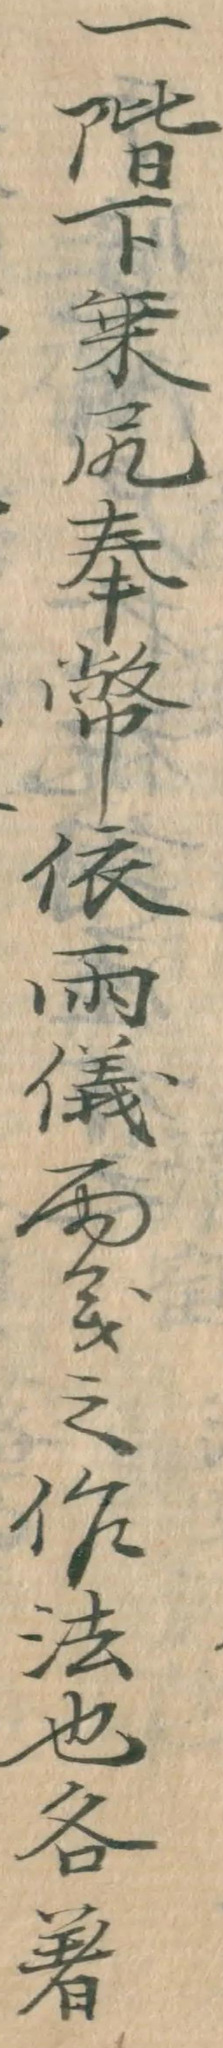一階下乗尻奉幣依雨儀雨義之作法也各着
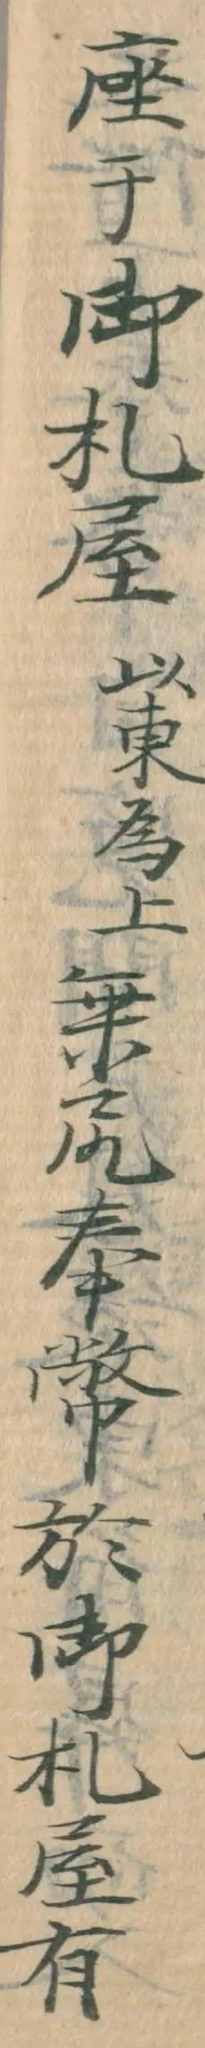座于御札屋以東為上乗尻奉幣於御机屋有

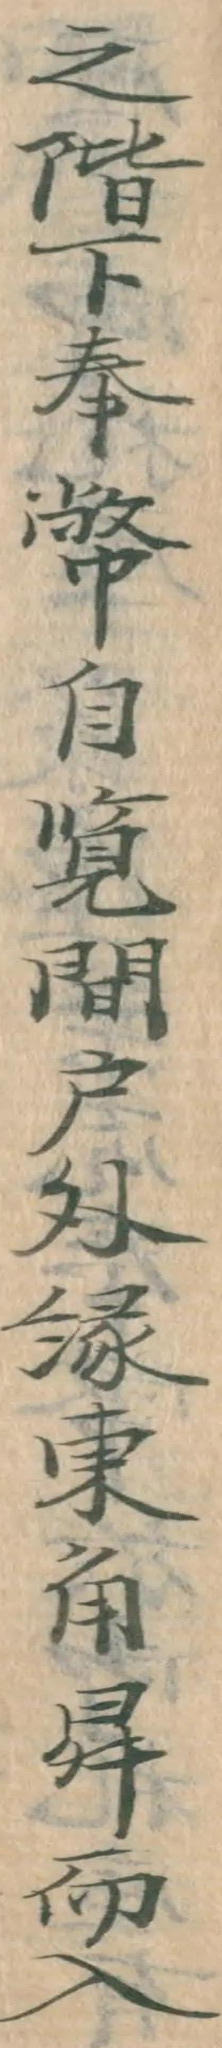之階下奉幣自覧間戸外縁東角昇而入
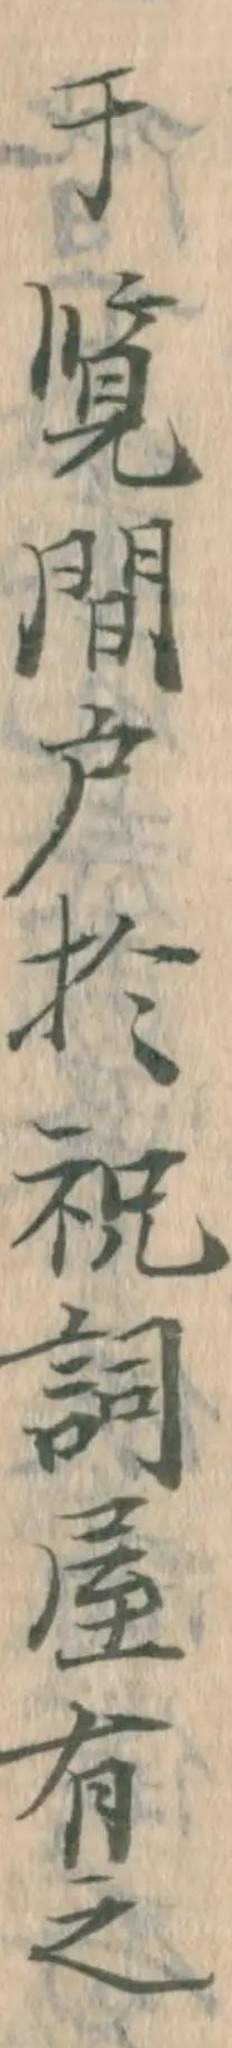于覧間戸於祝詞屋有之
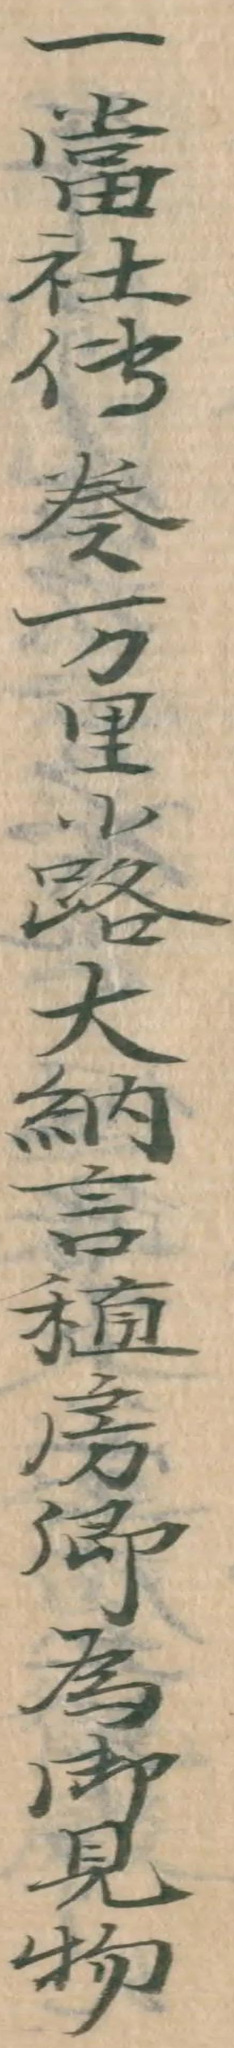一当社伝奏万里小路大納言植房卿為御見物
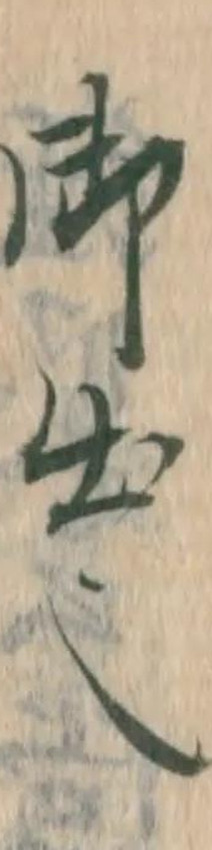御出也
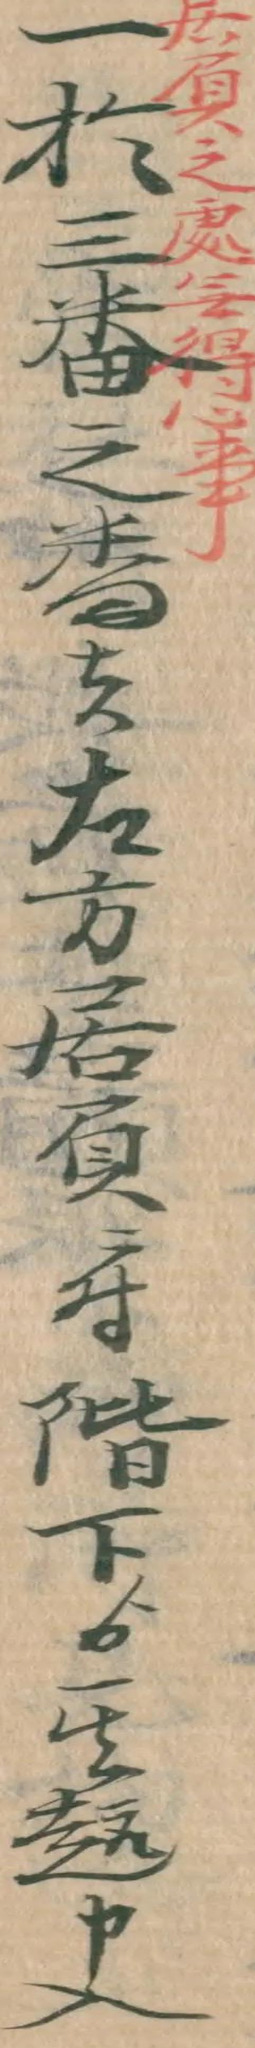一於三番之番者左方居負ニ付階下ゟ其趣申入
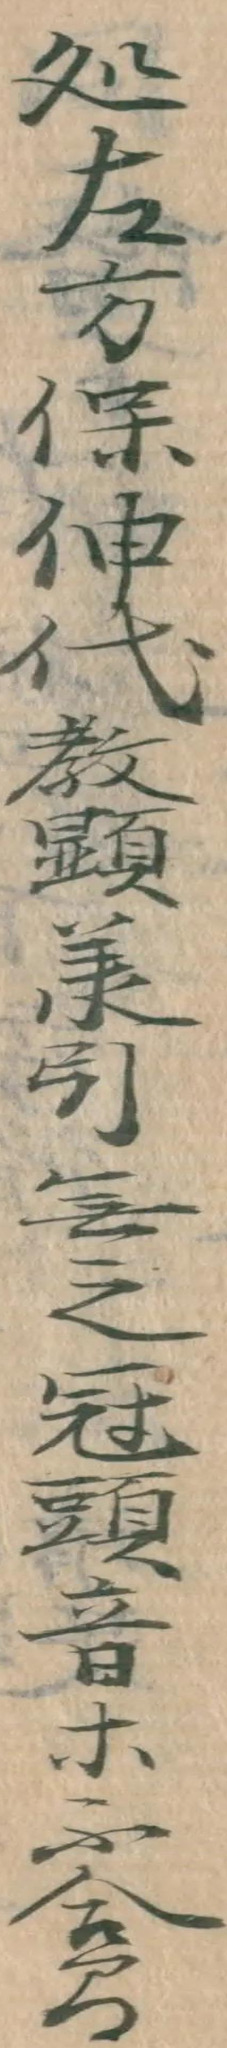処左方保伸代教顕承引無之冠頭音等不合間
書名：賀茂社記録. 第10冊
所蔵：国立国会図書館 National Diet Library, JAPAN
